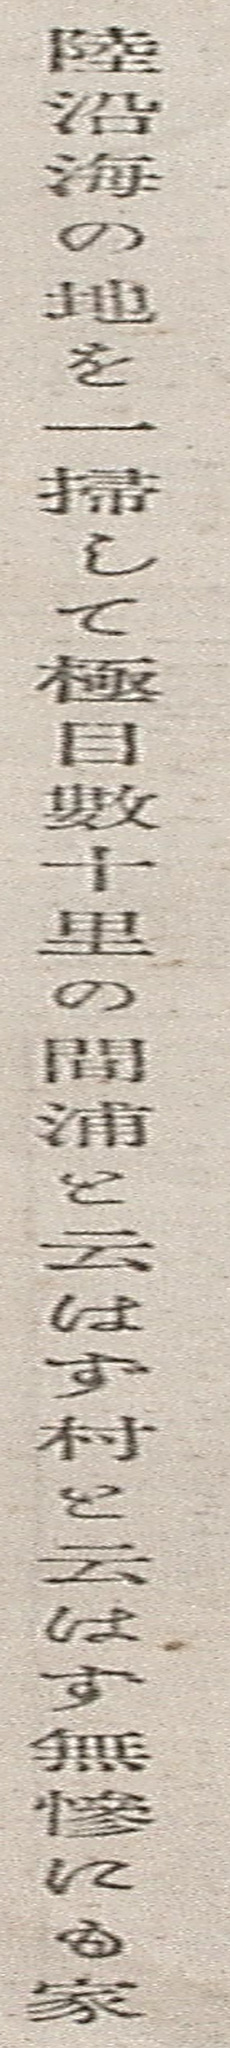陸沿海の地を一掃して極目数十里の間浦と云はず村と云はず無惨にも家
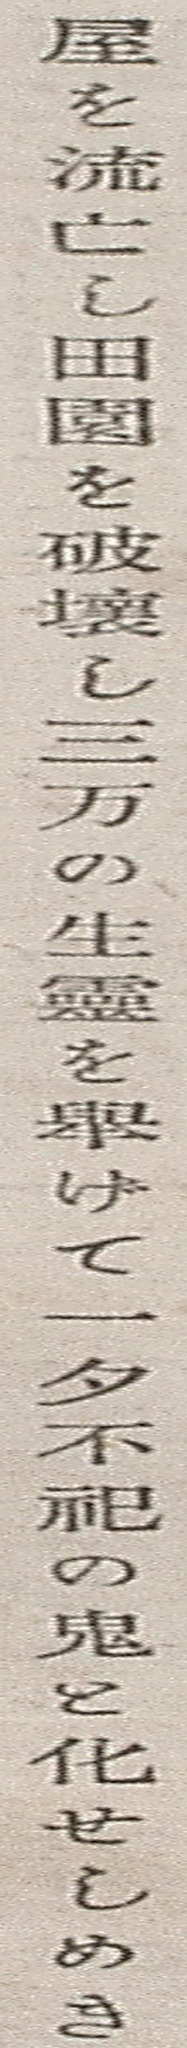屋を流亡し田園を破壊し三万の生霊を挙げて一夕不祀の鬼と化せしめき
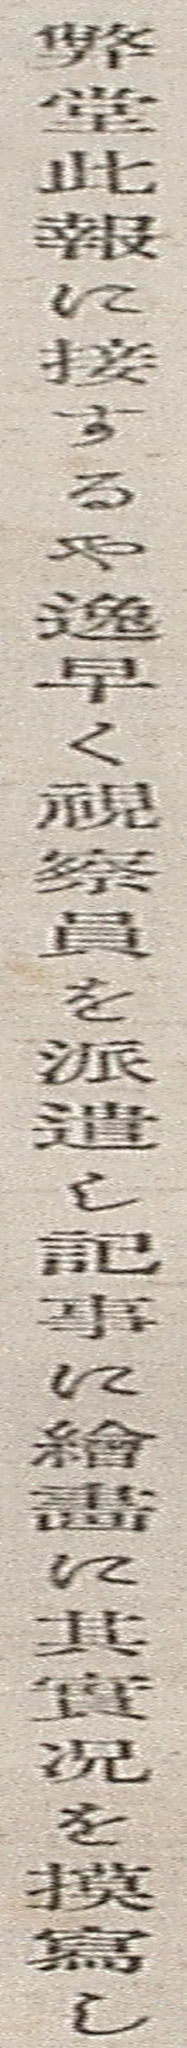弊堂此報に接するや逸早く視察員を派遣し記事に絵画に其実况を摸写し
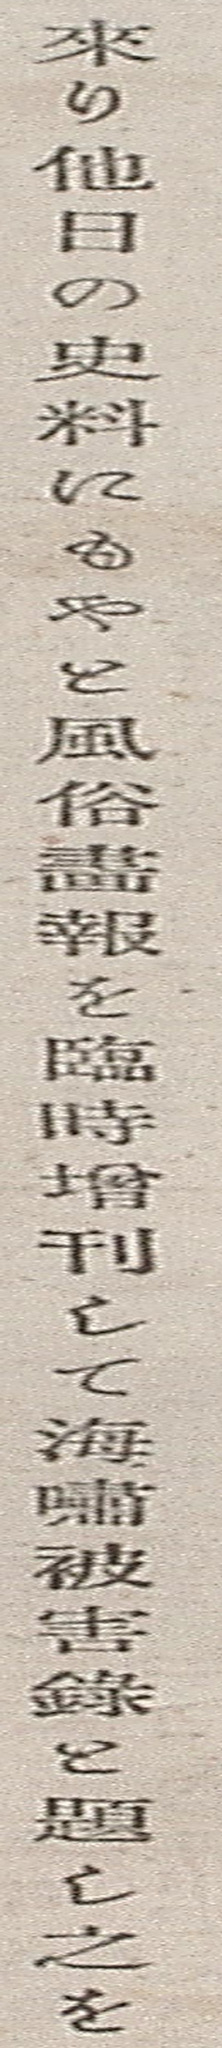来り他日の史料にもやと風俗画報を臨時増刊して海嘯被害録と題し之を
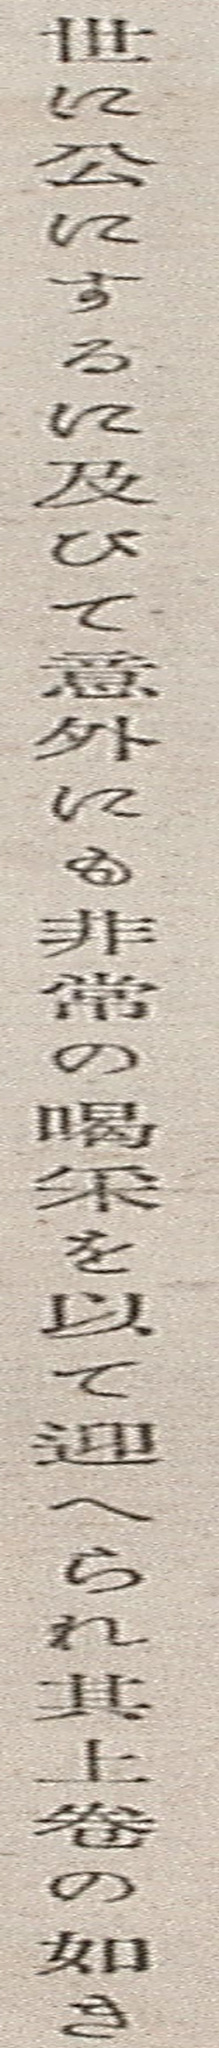世に公にするに及びて意外にも非常の喝采を以て迎へられ其上巻の如き
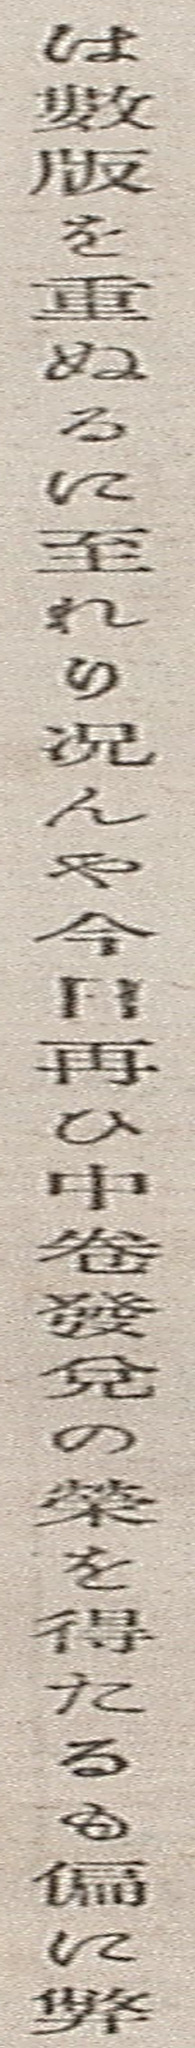は数版を重ぬるに至れり况んや今日再ひ中巻発兌の栄を得たるも偏に弊
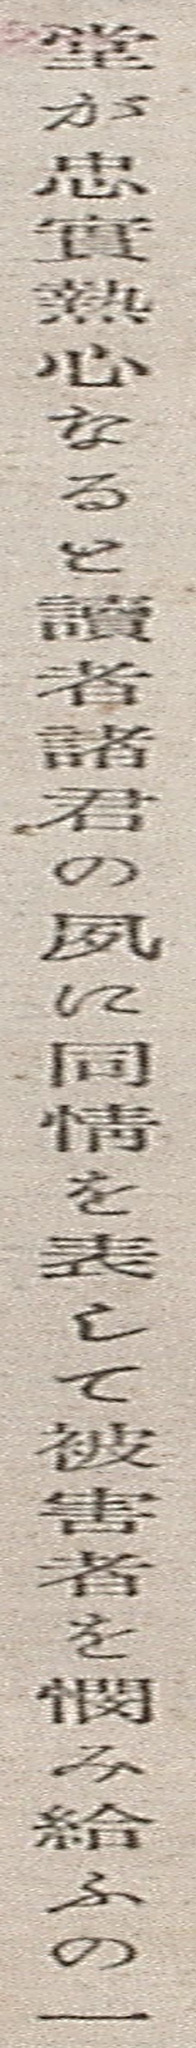堂が忠実熱心なると読者諸君の夙に同情を表して被害者を憫み給ふの一
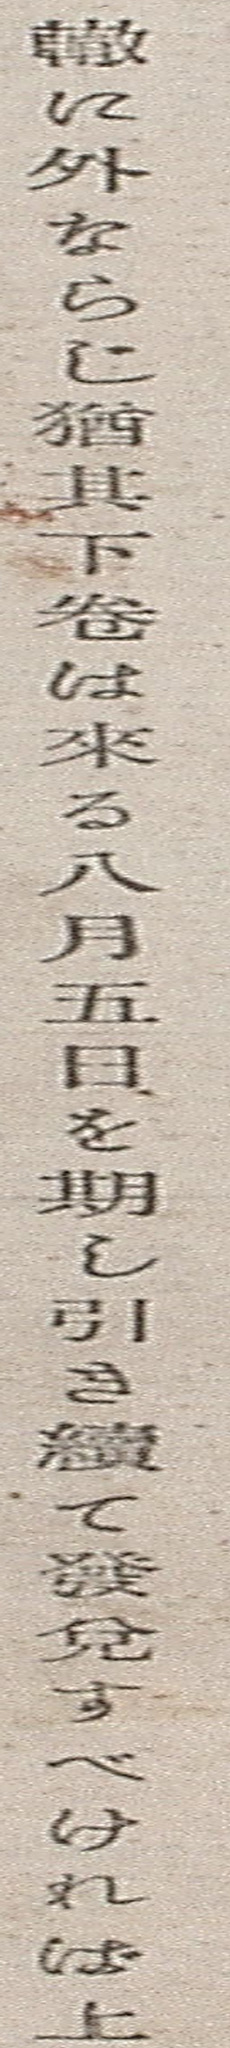轍に外ならじ猶其下巻は来る八月五日を期し引き続て発兌すべければ上
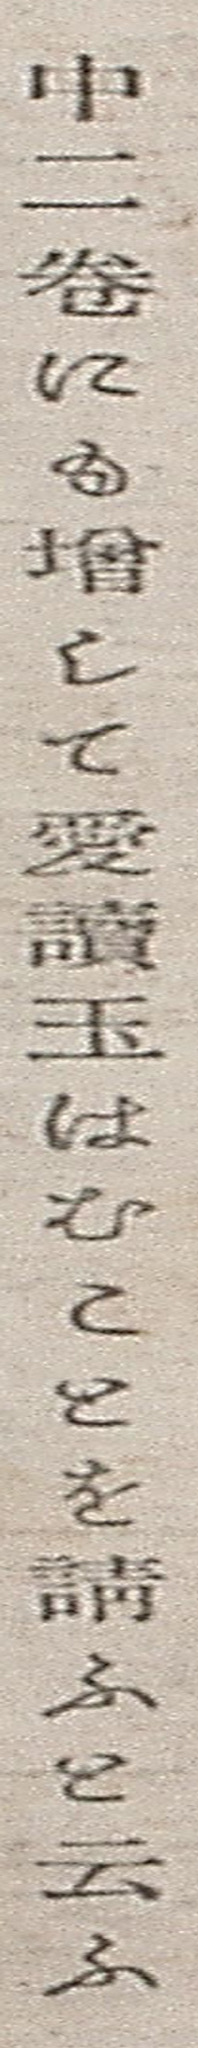中二巻にも増して愛読玉はむことを請ふと云ふ
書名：風俗畫報臨時増刊第百十九號　大海嘯被害録（中）
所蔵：東京大学地震研究所図書室 Earthquake Research Institute Library, The University of Tokyo, JAPAN
